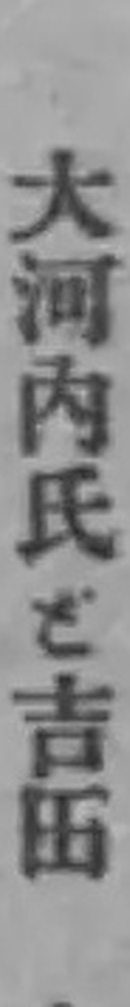大河内氏と其祖先
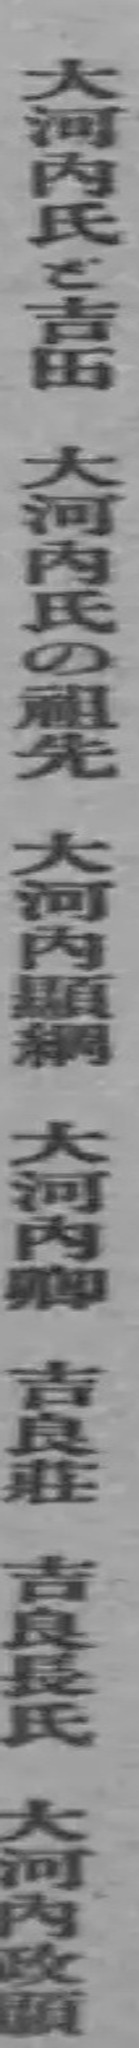大河内氏と吉田大河内氏の祖先大河内顕綱大河内卿吉良荘吉良長氏大河内政顕
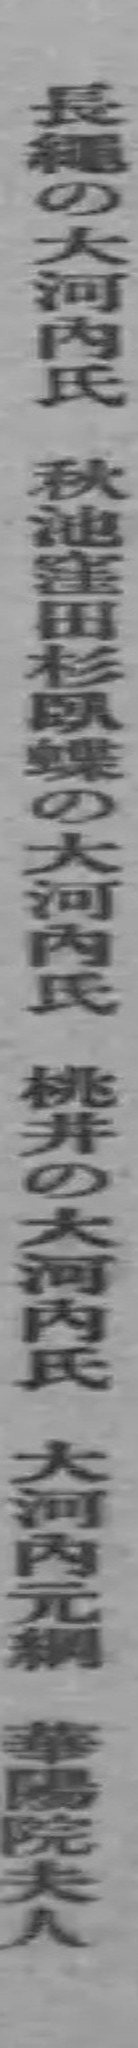長縄の大河内氏秋池窪田杉臥蝶の大河内氏桃井の大河内氏大河内元網華陽院夫人
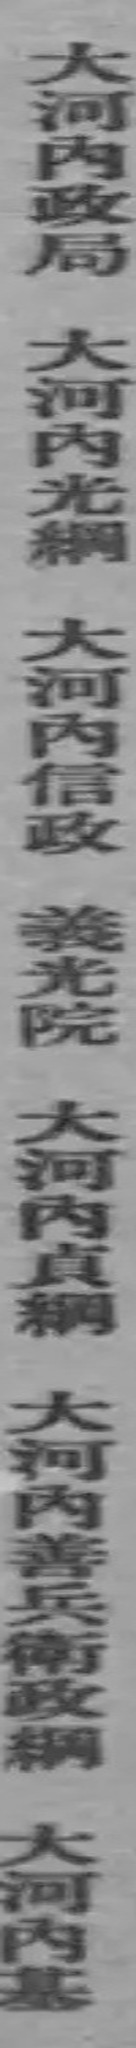大河内政局大河内光綱大河内信政義光院大河内貞綱大河内善兵衛政綱大河内基
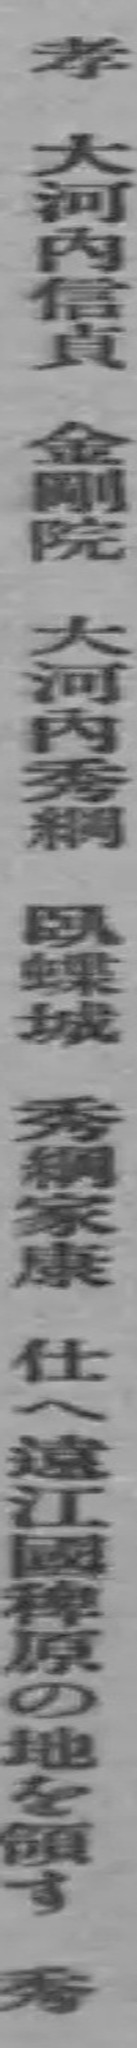孝大河内信貞金剛院大河内秀綱臥蝶城秀綱家康仕へ遠江国稗原の地を領す秀
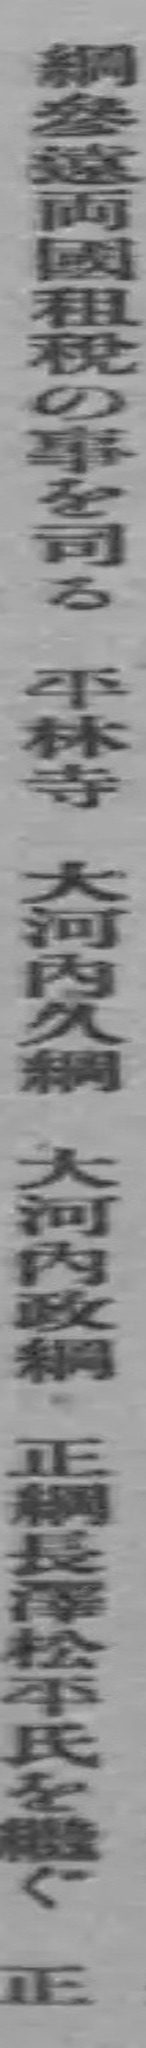綱参遠両国租税の事を司る平林寺大河内久綱大河内政綱正綱長沢松平氏を継ぐ正
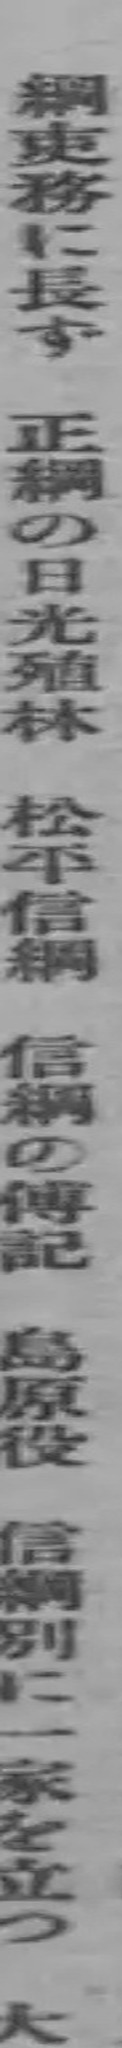綱吏務に長ず正綱の日光殖林松平信綱信綱の伝記島原役信綱別に一家を立つ大
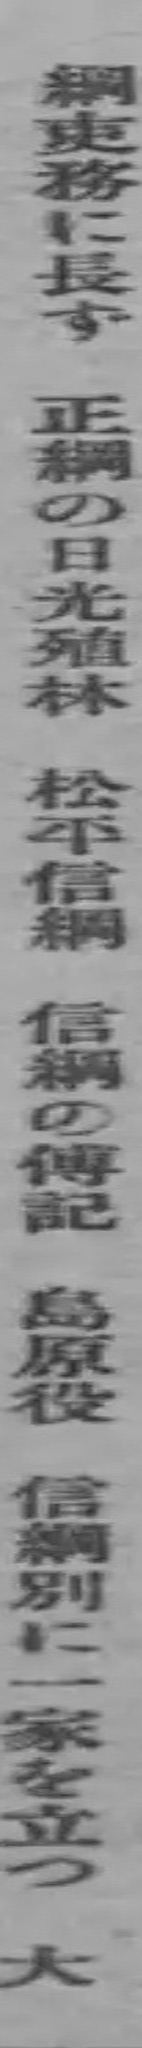綱吏務に長ず正綱の日光殖林松平信綱信綱の伝記島原役信綱別に一家を立つ大
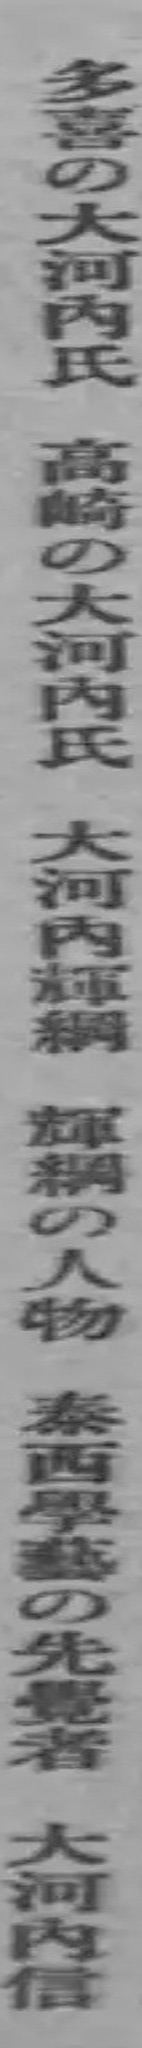多喜の大河内氏高崎の大河内氏大河内輝綱輝綱の人物泰西学芸の先覚者大河内信
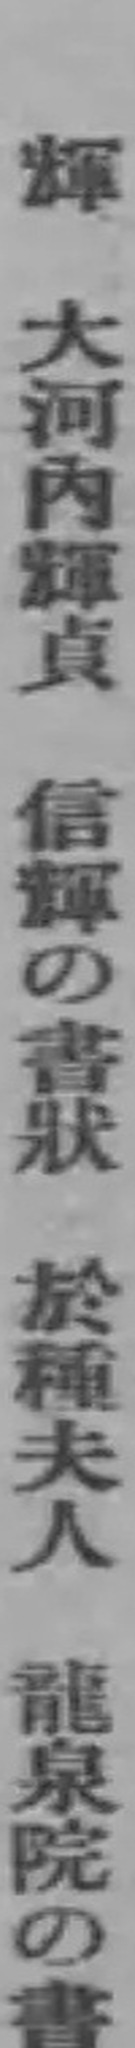輝大河内輝貞信輝の書状於種夫人龍泉院の書翰
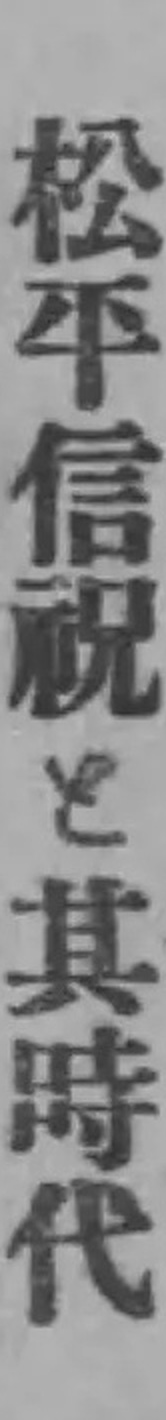松平信祝と其時代
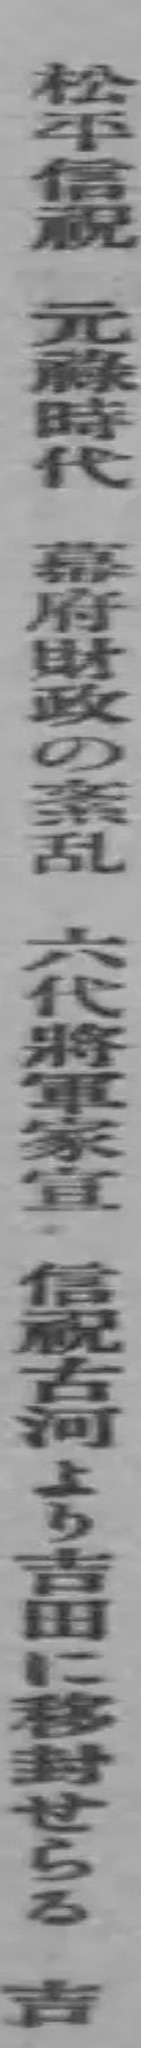松平信祝元禄時代幕府財政の紊乱六代将軍家宣信祝古河より吉田に移封せらる吉
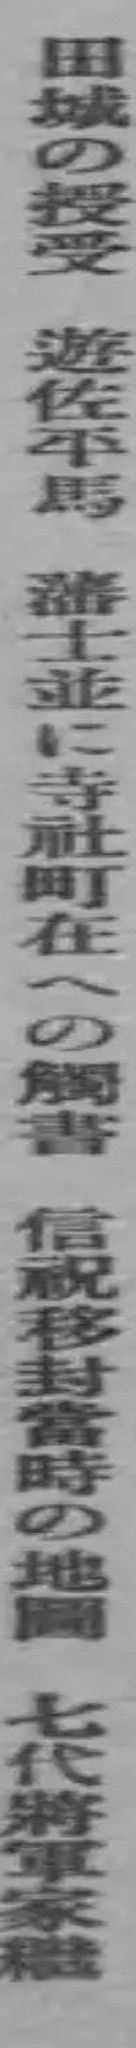田城の授受遊佐平馬藩士並に寺社町在への触書信祝移封当時の地図七代将軍家継
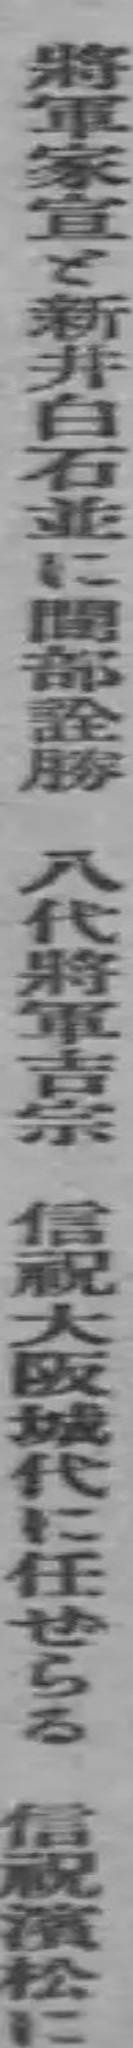将軍家宣と新井白石並に間部詮勝八代将軍吉宗信祝大阪城代に任ぜらる信祝浜松に移
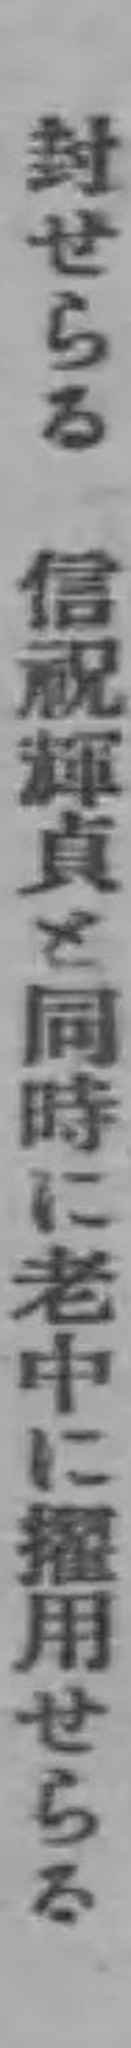封せらる信祝輝貞と同時に老中に擢用せらる
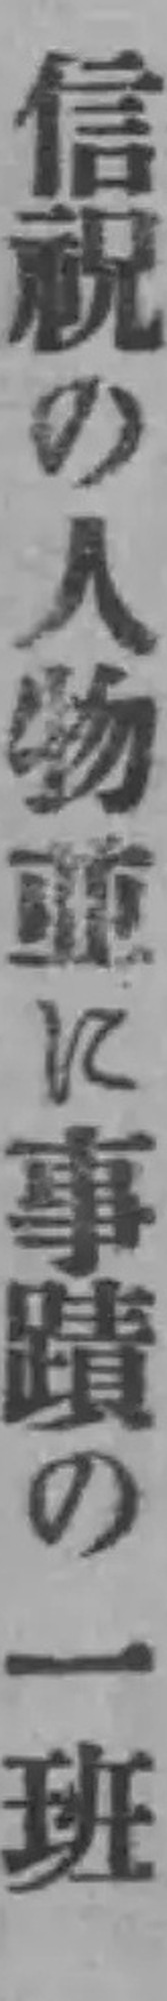信祝の人物並に事蹟の一班
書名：豊橋市史談
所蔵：国立国会図書館 National Diet Library, JAPAN
